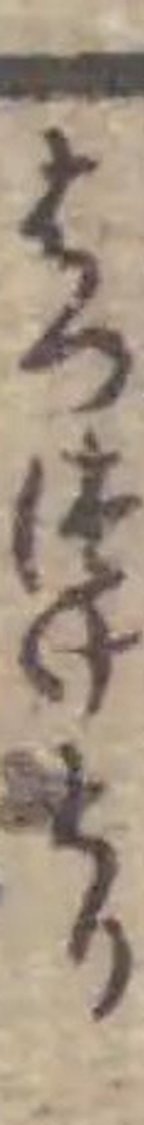はつつけとり
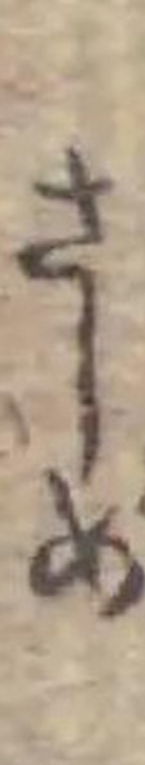さしめ
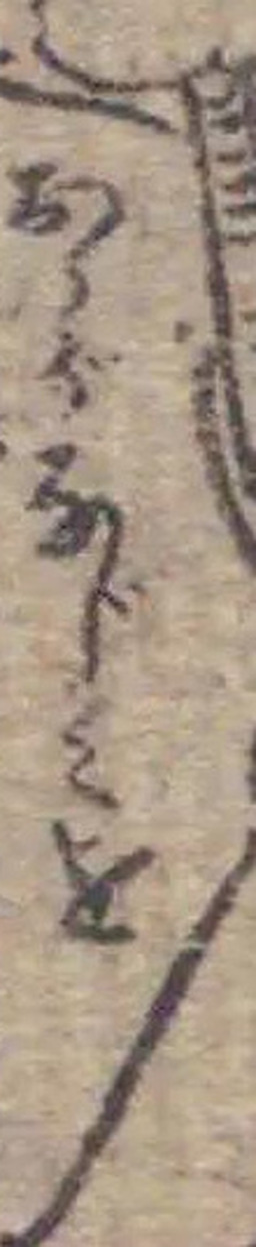おらがなじみを
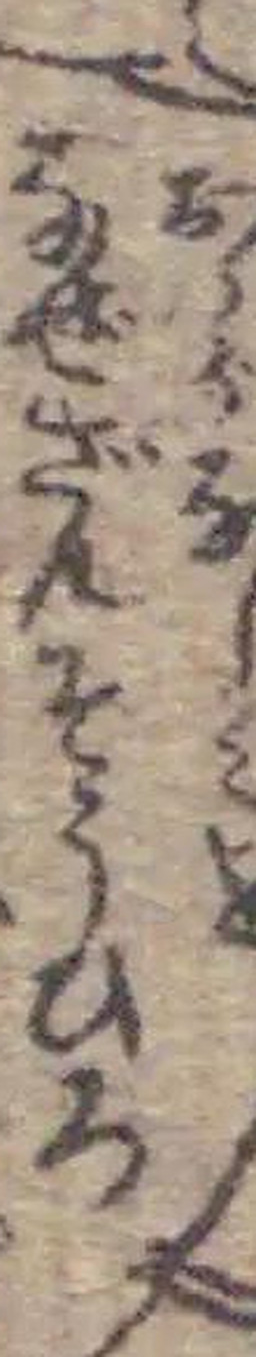なぜざんそうひろ
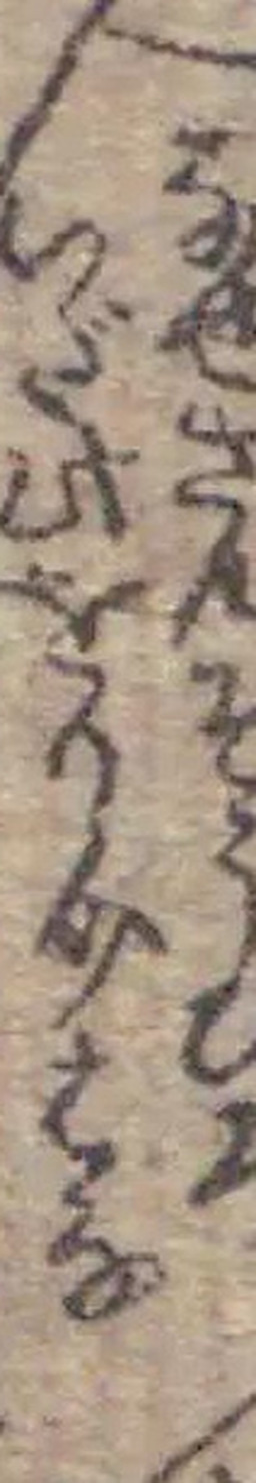いだ此をり介はな
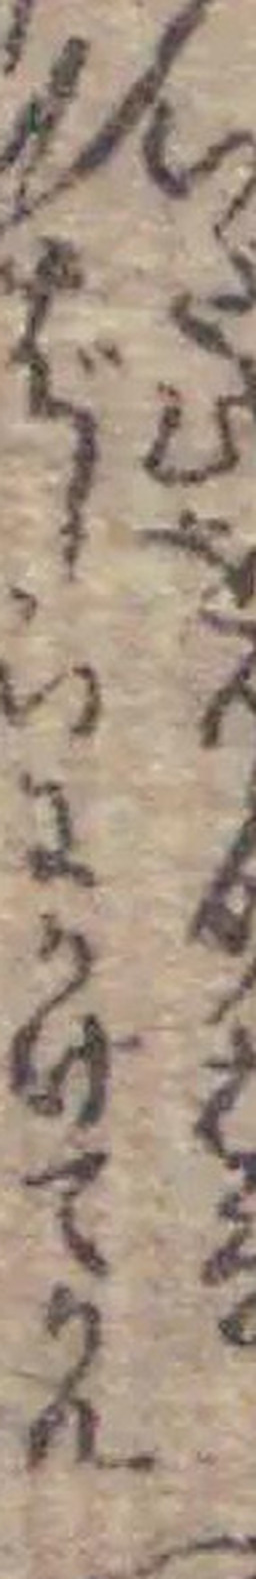ばしらにかけてかん
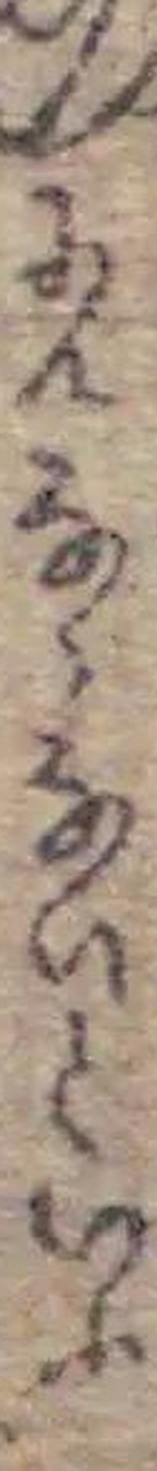にんならないといふ

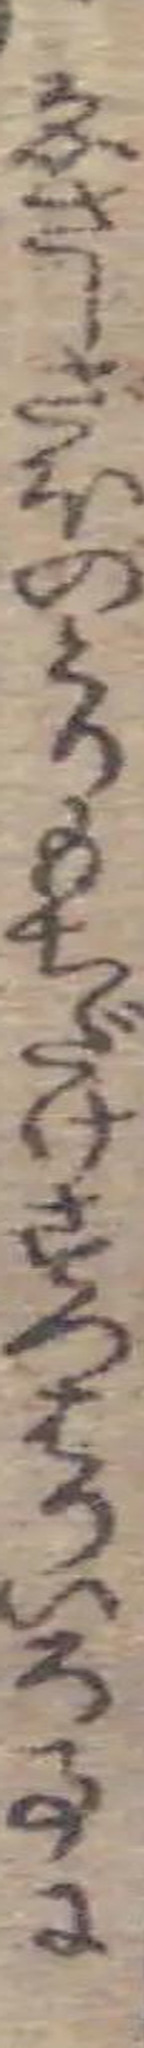ゑさしざほのとりもちだけすつはりいろ事に
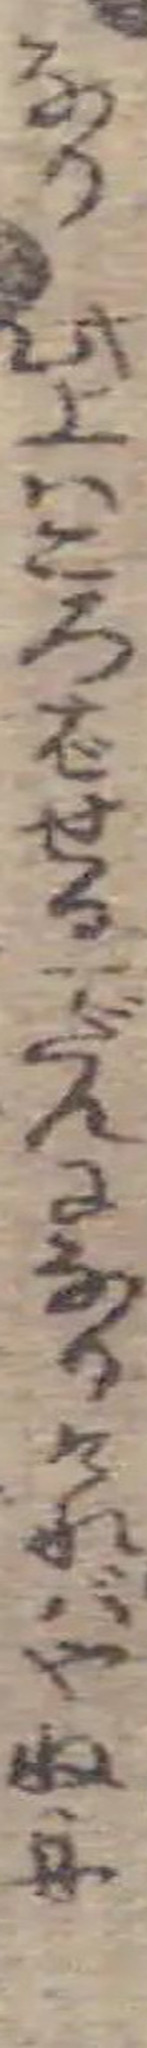なり此上はころばせる一だんになりければやね舟
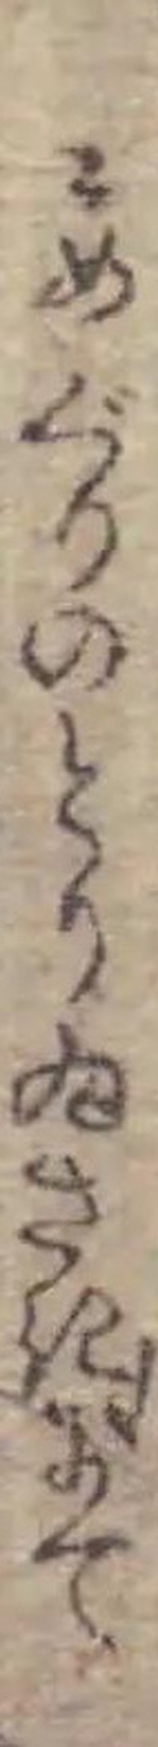みめぐりのとりゐさきにて
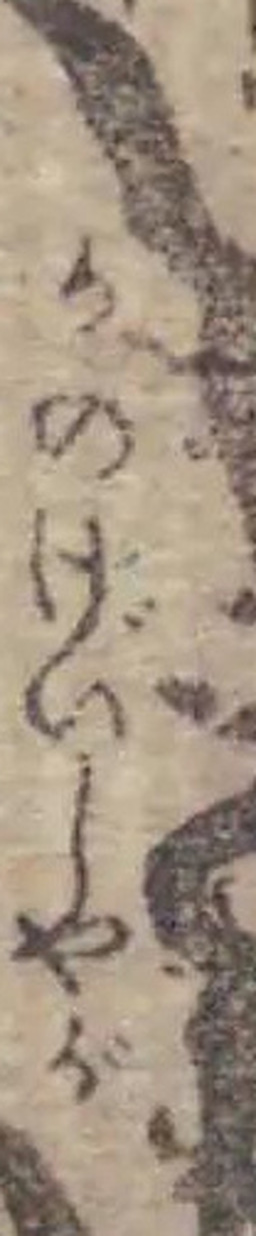かのげいしやが
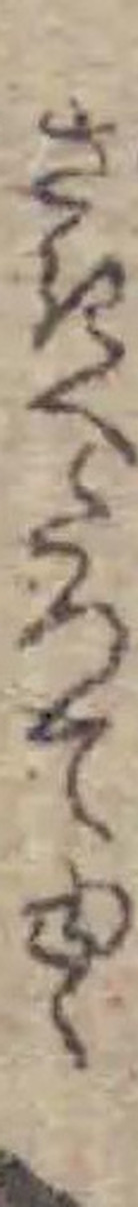さきへたつてゆく
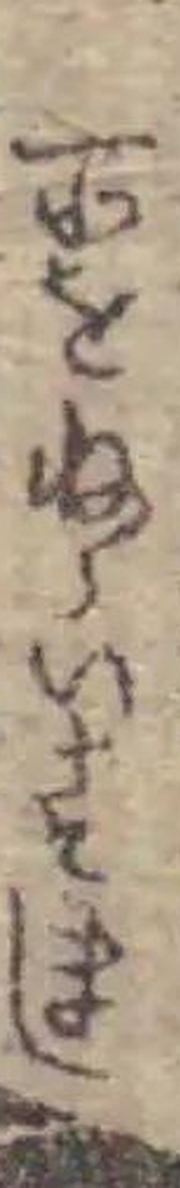所をねらいすまし
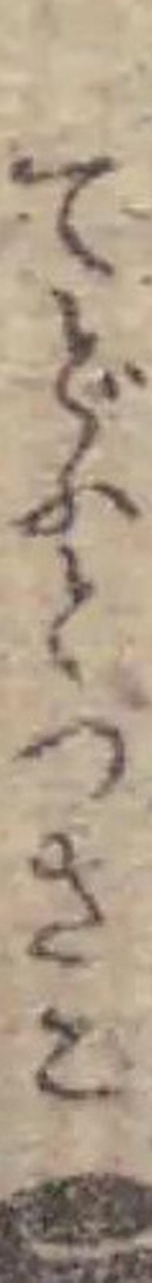てどふとつきこ
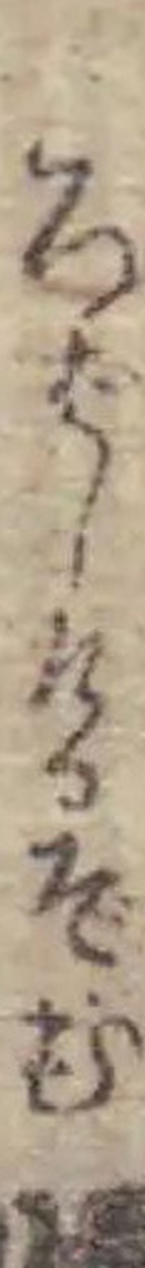ろばしけるぞむ
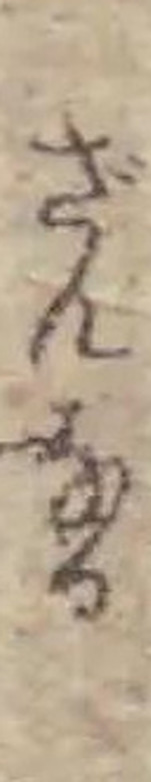ざんなる
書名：色男其処此処 3巻
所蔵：国立国会図書館 National Diet Library, JAPAN
